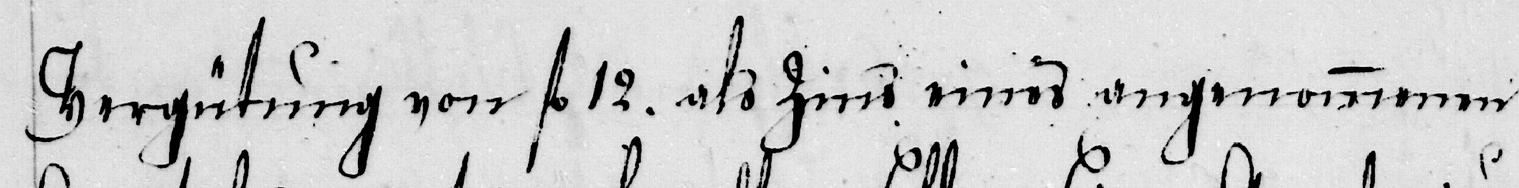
Vergütung von fl. 12. als Zins eines angenommenen
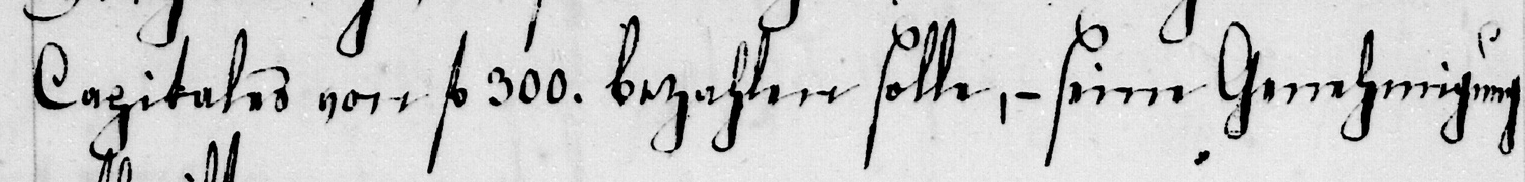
Capitals von fl. 300. bezahlen solle, – seine Genehmigung
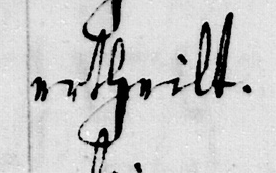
ertheilt.
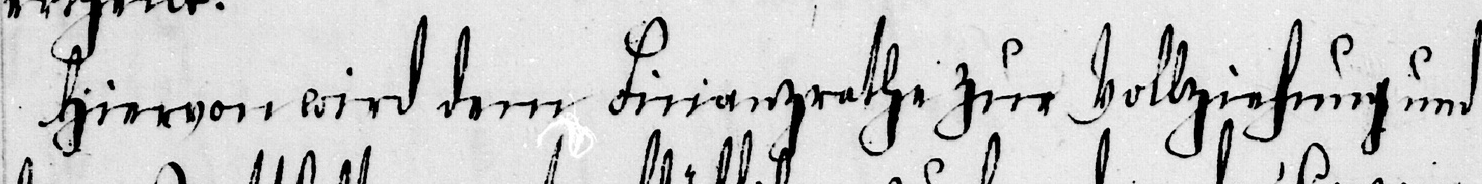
Hiervon wird dem Finanzrathe zur Vollziehung und
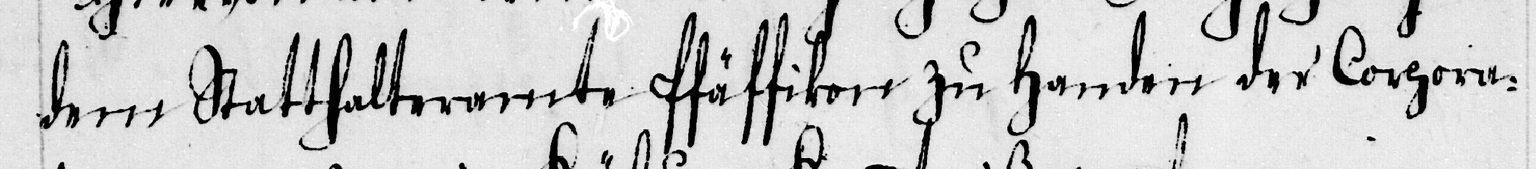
dem Statthalteramte Pfäffikon zu Handen der Corpora¬
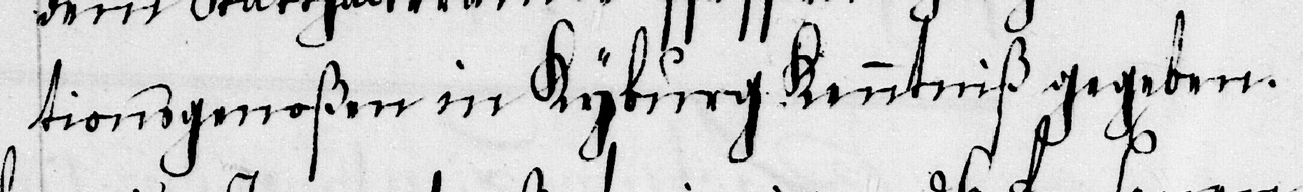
tionsgenoßen in Kyburg Kenntniß gegeben.
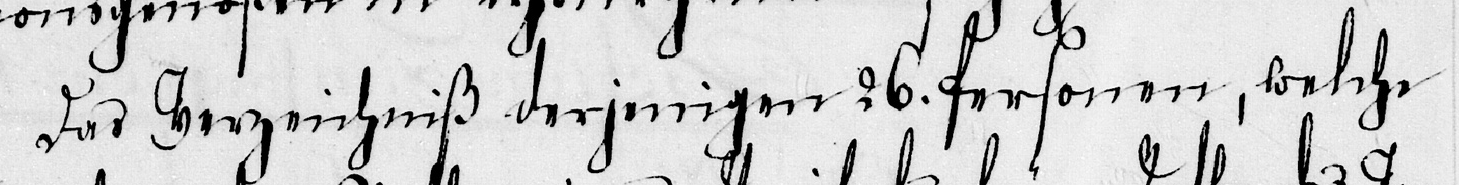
Das Verzeichniß derjenigen 26. Personen, welche
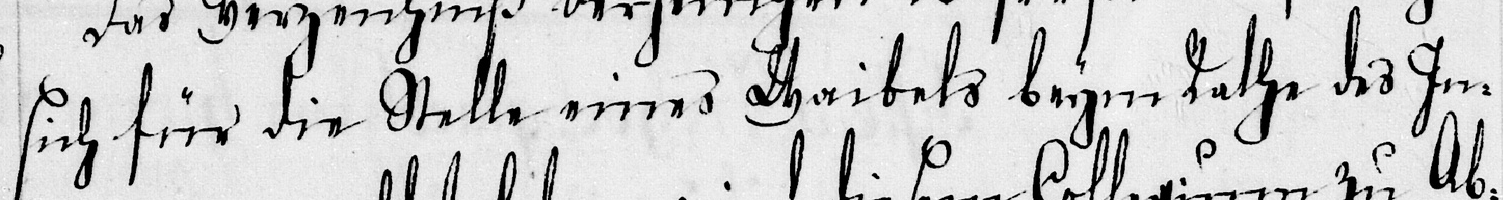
sich für die Stelle eines Waibels beym Rathe des In¬
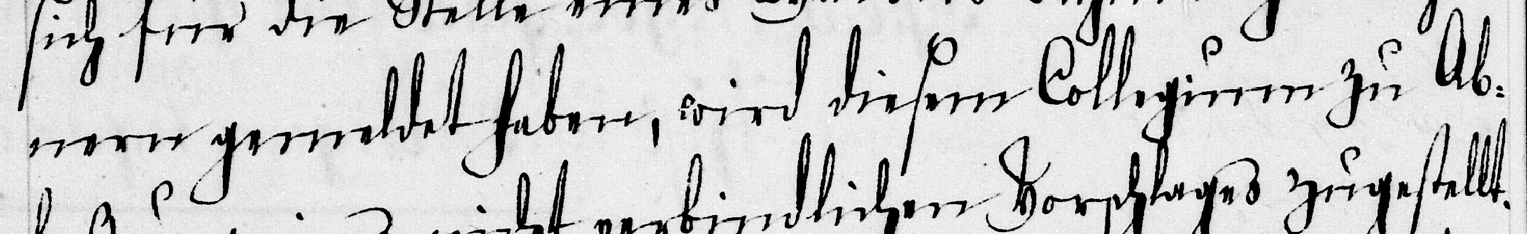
nern gemeldet haben, wird diesem Collegium zu Ab¬
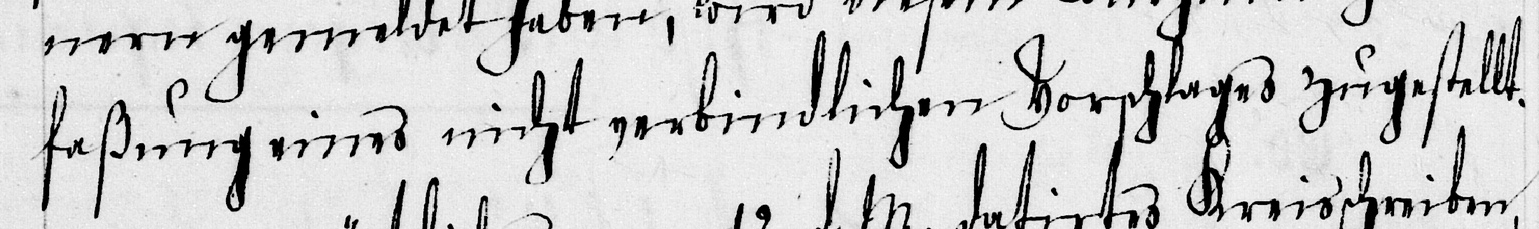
faßung eines nicht verbindlichen Vorschlages zugestell¬
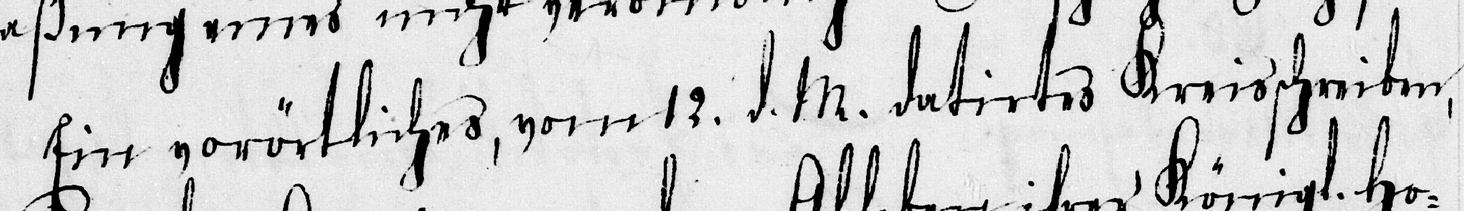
Ein vorörtliches, vom 12. d. M. datirtes Kreisschreiben,
